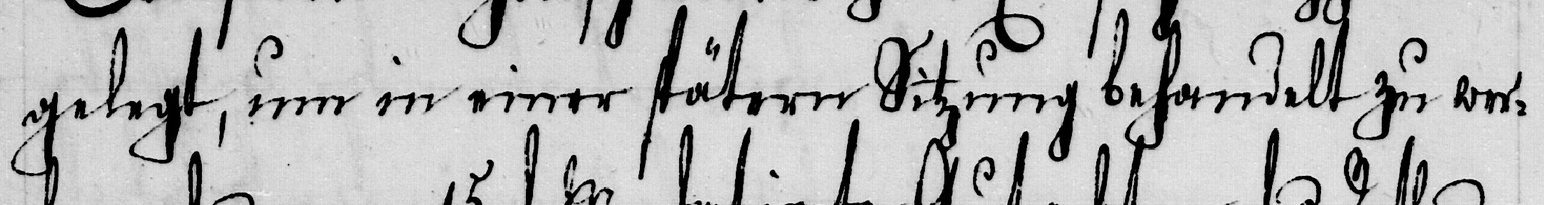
gelegt, um in einer spätern Sitzung behandelt zu wer¬
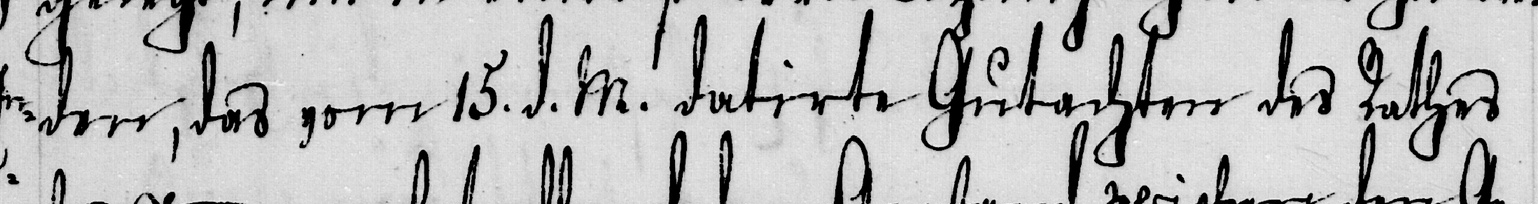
den, das vom 15. d. M. datirte Gutachten des Rathes
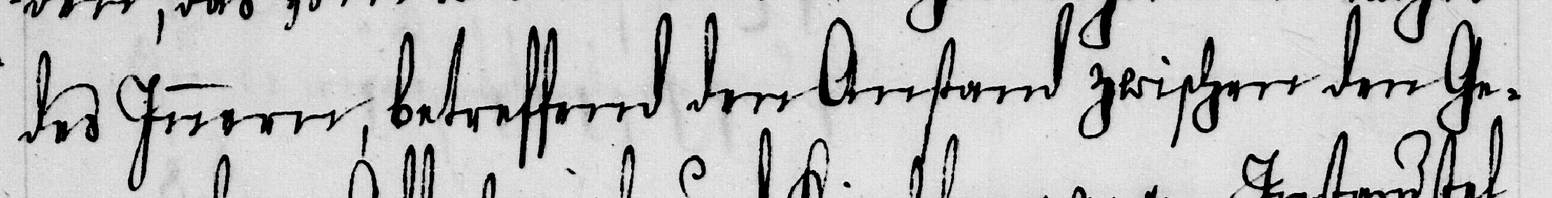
des Innern, betreffend den Anstand zwischen den Ge¬
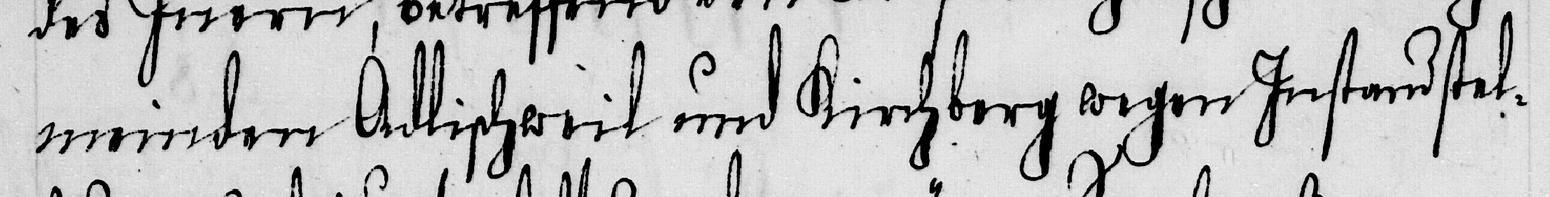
meinden Adlischweil und Kirchberg wegen Instandstel¬
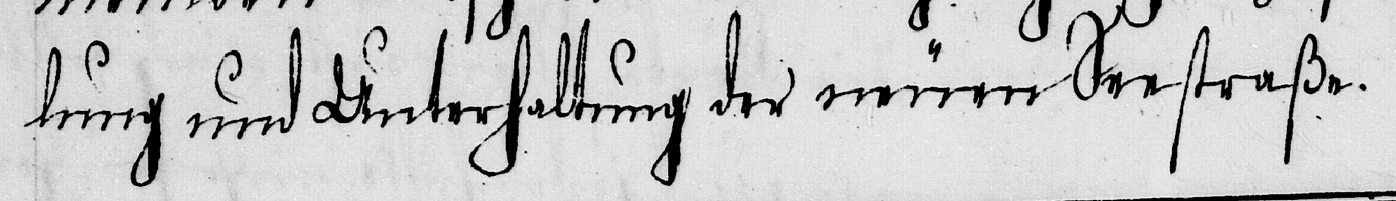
lung und Unterhaltung der neuen Seestraße.
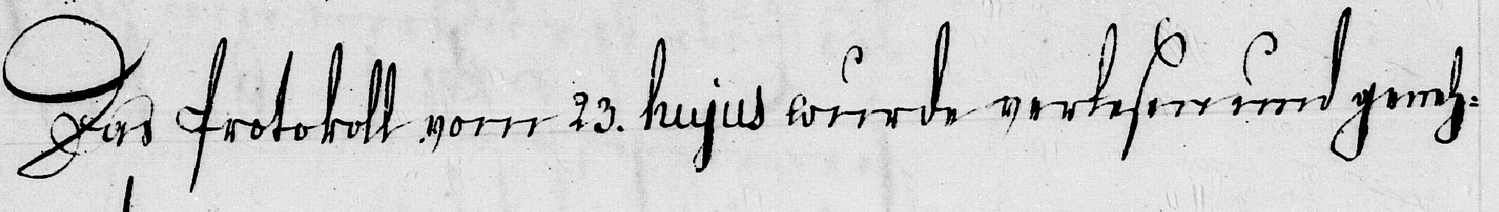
Das Protokoll vom 23. hujus wurde verlesen und geneh¬
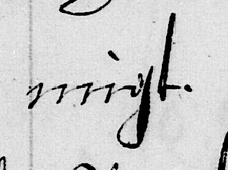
migt.
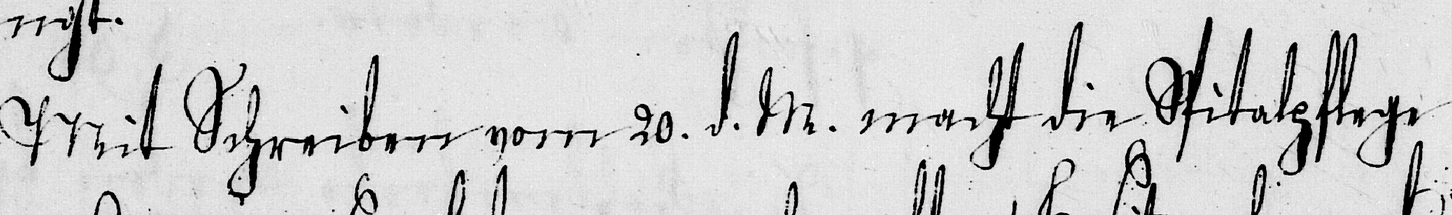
Mit Schreiben vom 20. d. M. macht die Spitalpflege
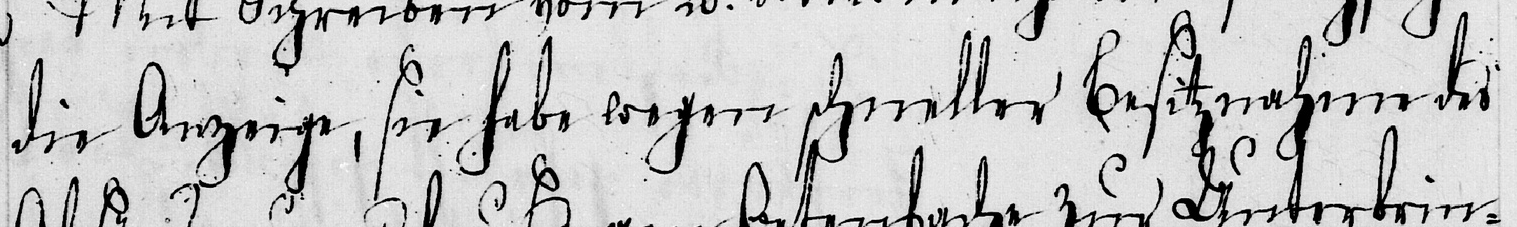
die Anzeige, sie habe wegen schneller Besitznahme des
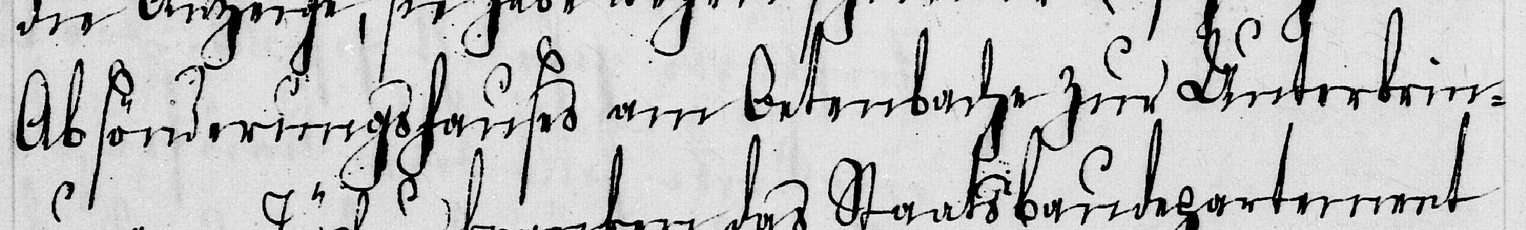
Absönderungshauses am Oetenbach zur Unterbrin¬
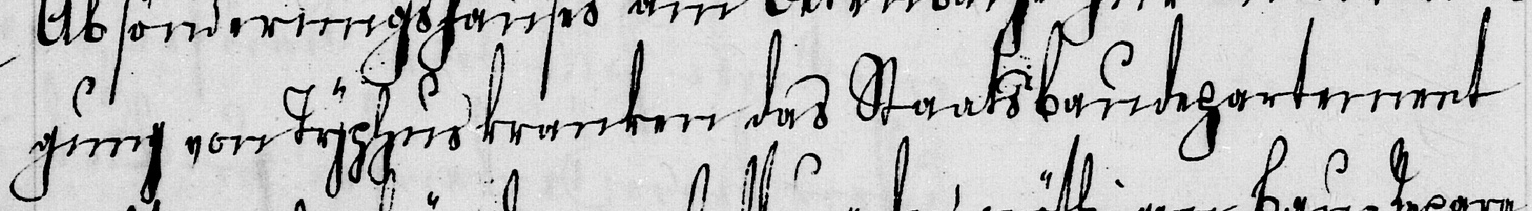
gung von Typhuskranken das Staatsbaudepartement
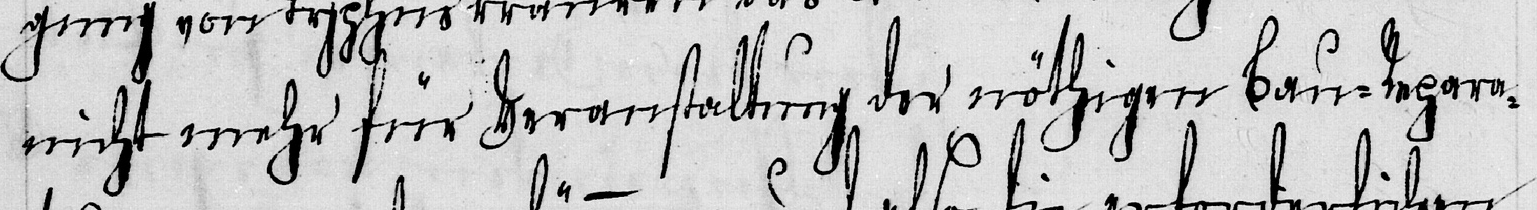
nicht mehr für Veranstaltung der nöthigen Bau-Repara¬
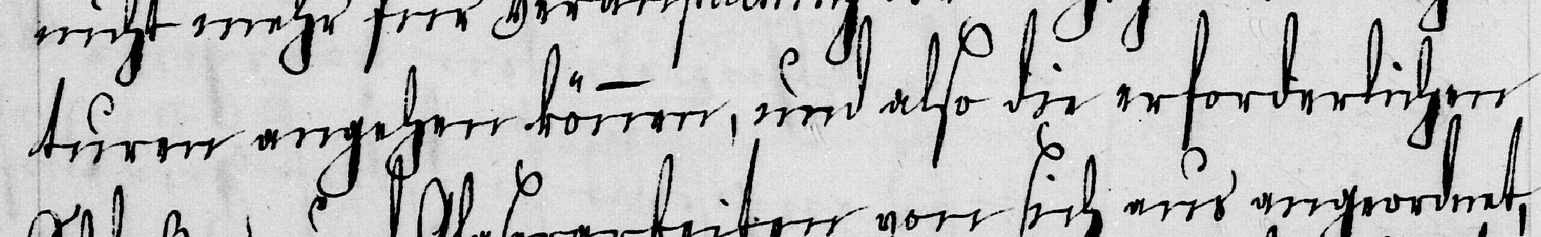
turen angehen können, und also die erforderlichen
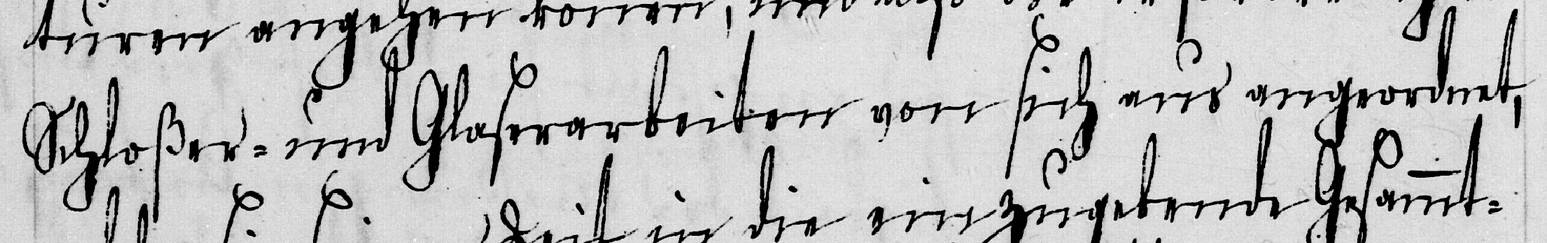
Schloßer- und Glaserarbeiten von sich aus angeordnet,
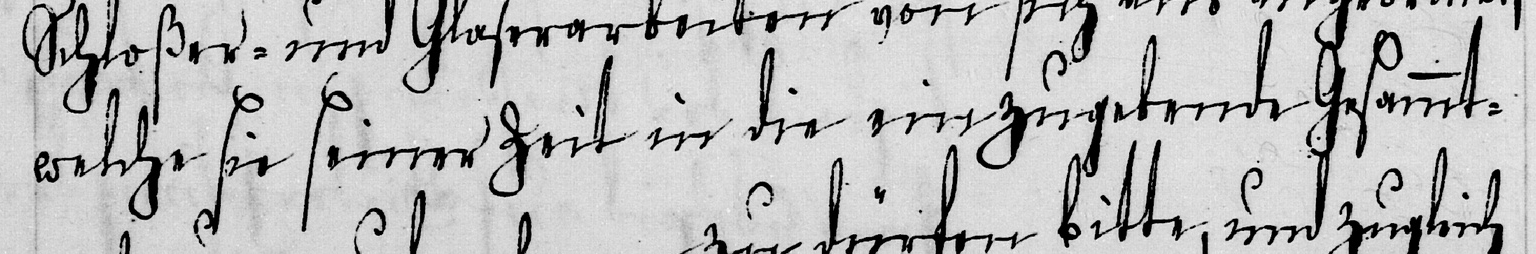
welche sie seiner Zeit in die einzugebende Gesammt¬
